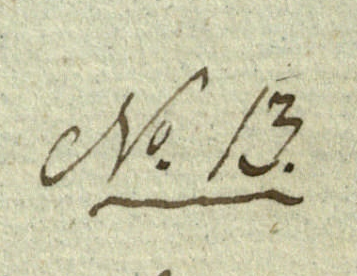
No 13.
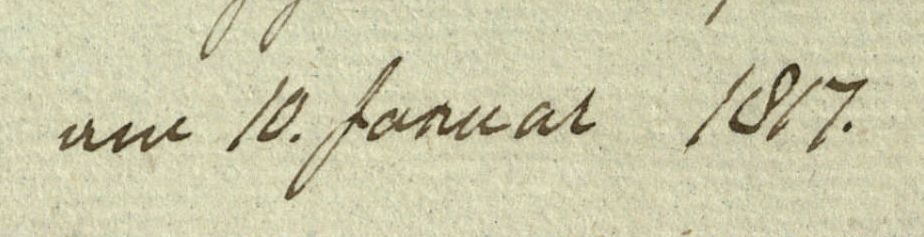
am 10. Januar 1817.
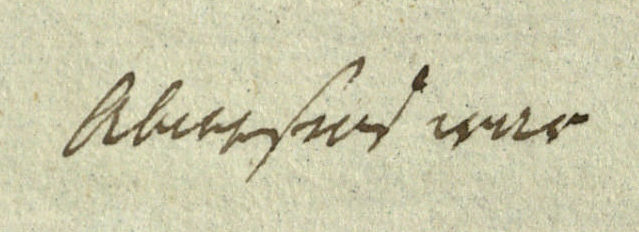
Abwesend war
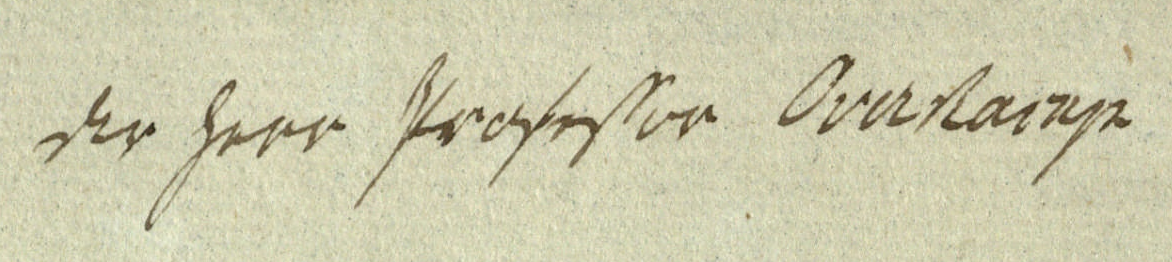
der Herr Professor Overkamp.
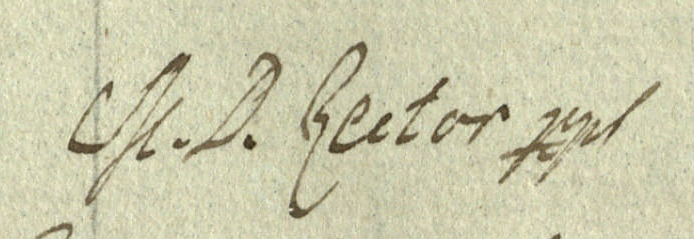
M. D. Rector ppt.
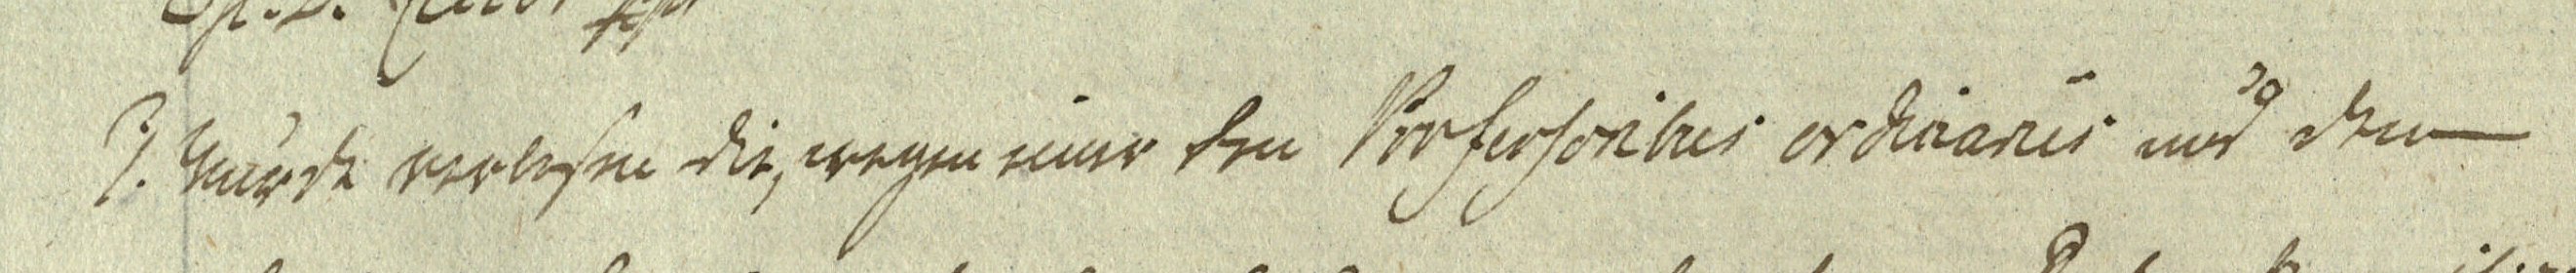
1. Wurde verlesen die, wegen einer den Professoribus ordinariis und dem
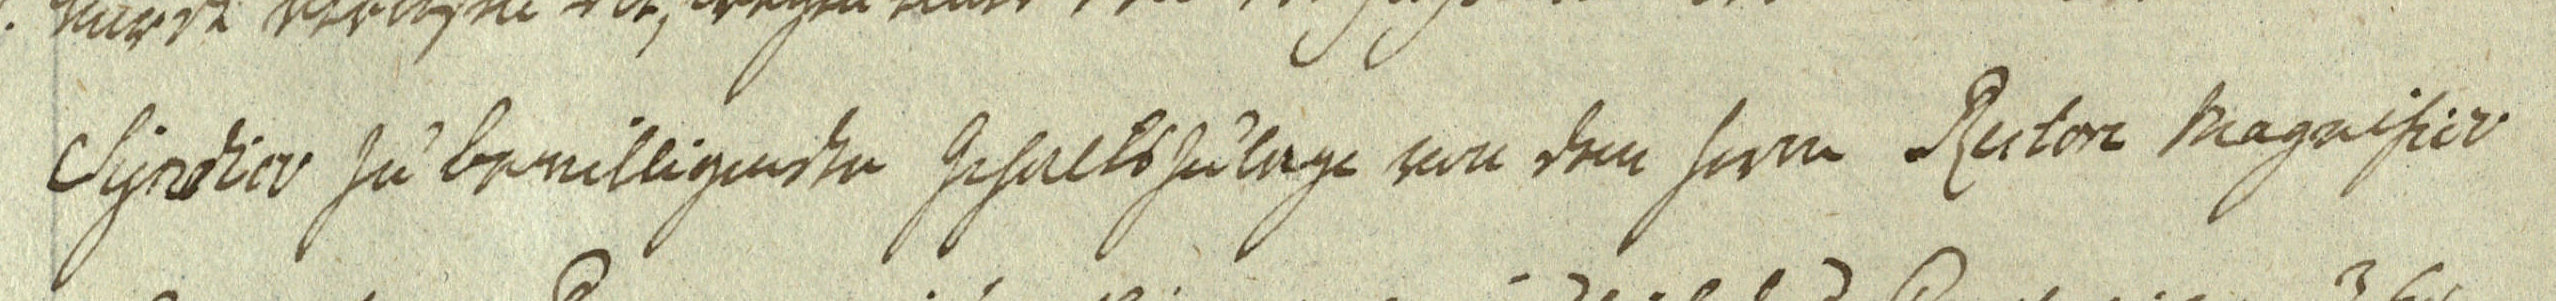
Sÿndico zu bewilligenden Gehaltszulage von dem Herrn Rectore Magnifico
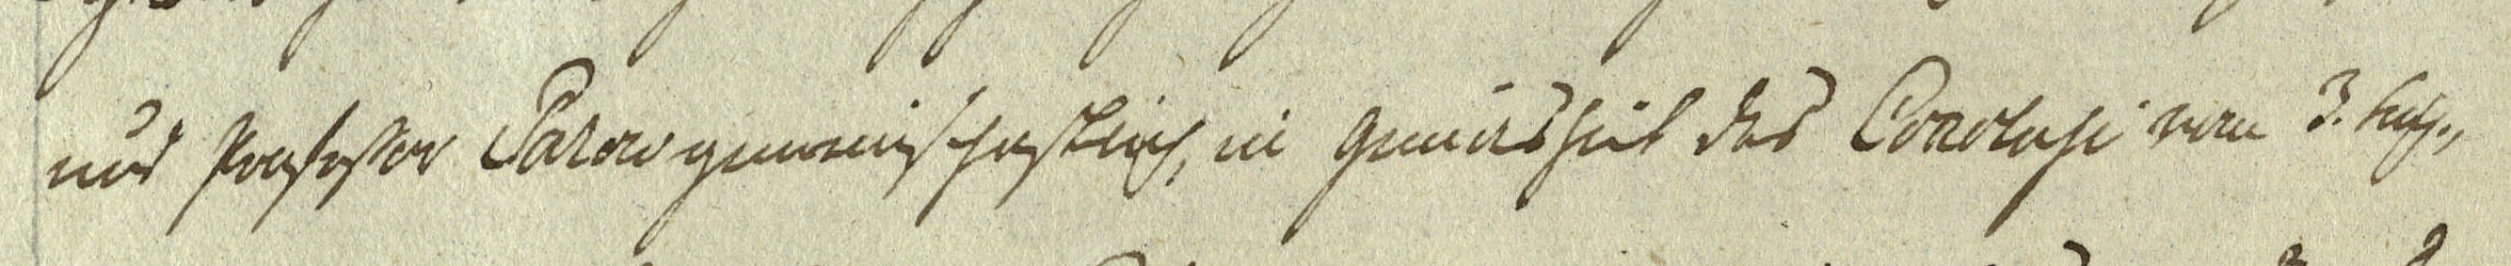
und Professor Parow gemeinschaftlich, in Gemäsheit des Conclusi vom 3 huj.,
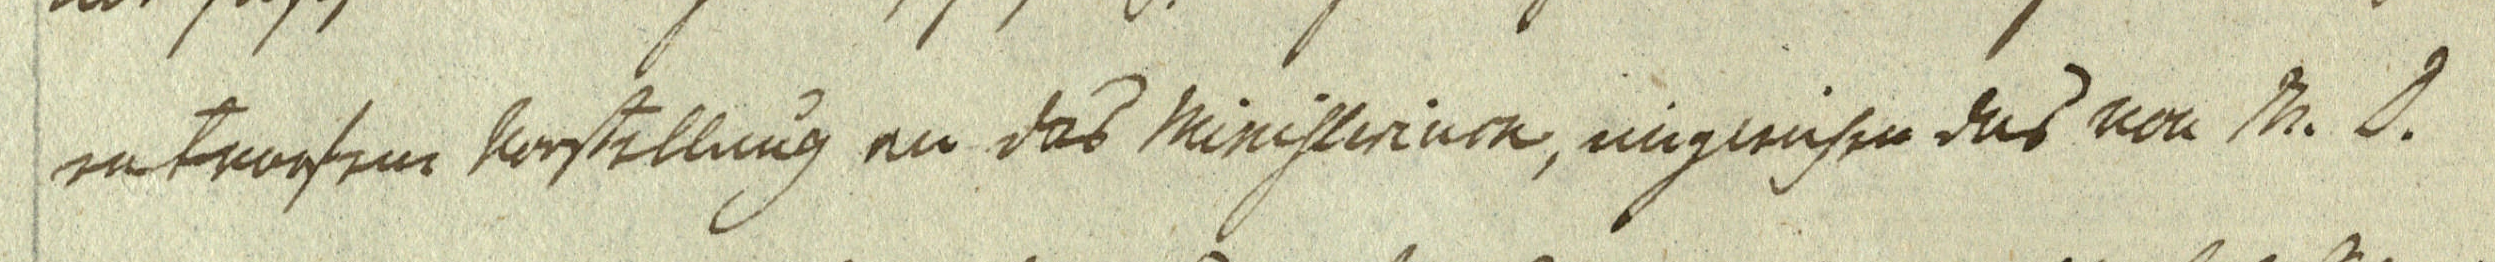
entworfene Vorstellung an das Ministerium, imgleichen das von M. D.
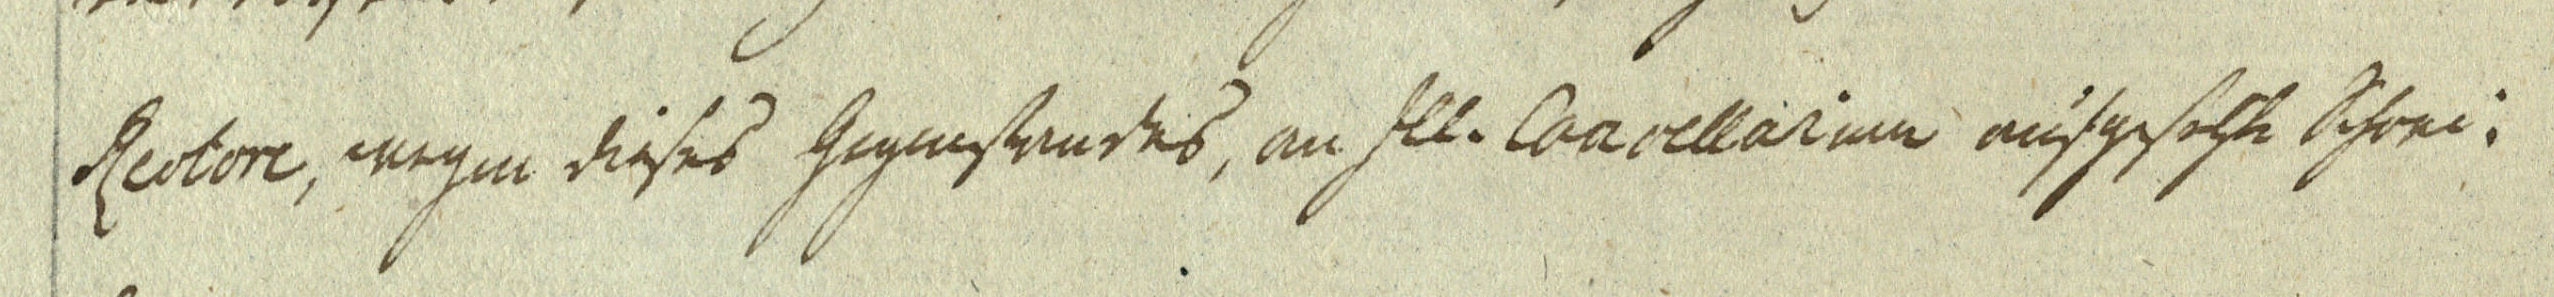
Rectore, wegen dieses Gegenstandes, an Ill. Cancellarium aufgesetzte Schrei¬
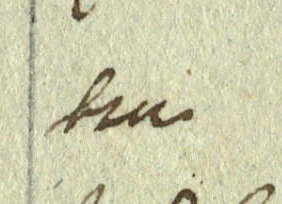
ben.
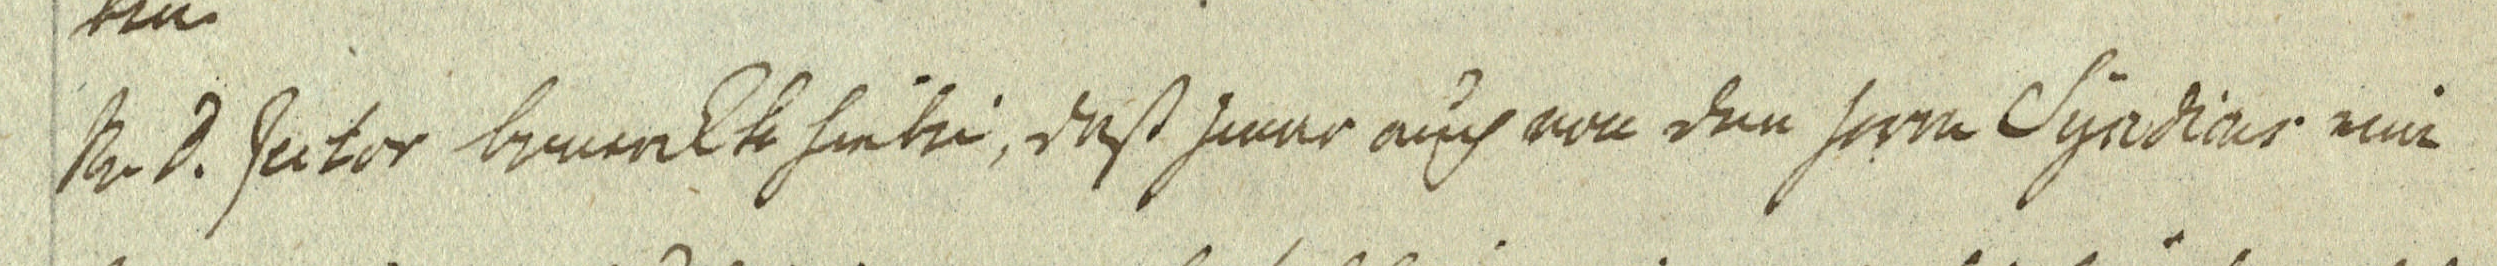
M. D. Rector bemerckte hiebei, daß zwar auch von dem Herrn Sÿndicus eine
